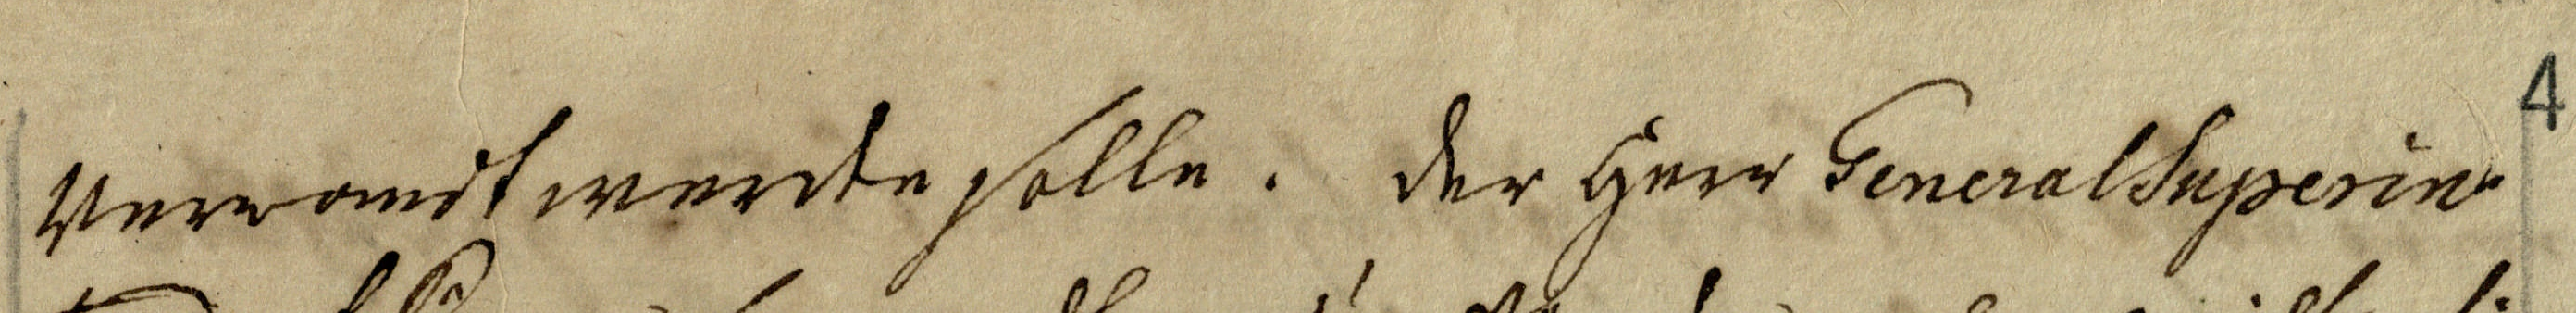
verwandt werden solle. Der Herr GeneralSuperin¬
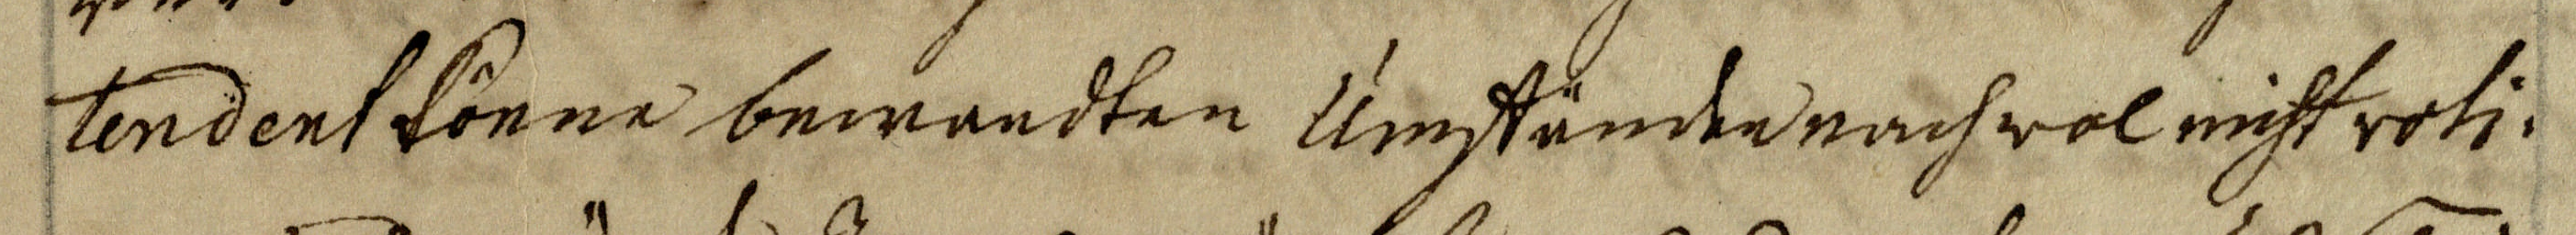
tendent könne bewandten Umständen nach wohl nicht voti¬
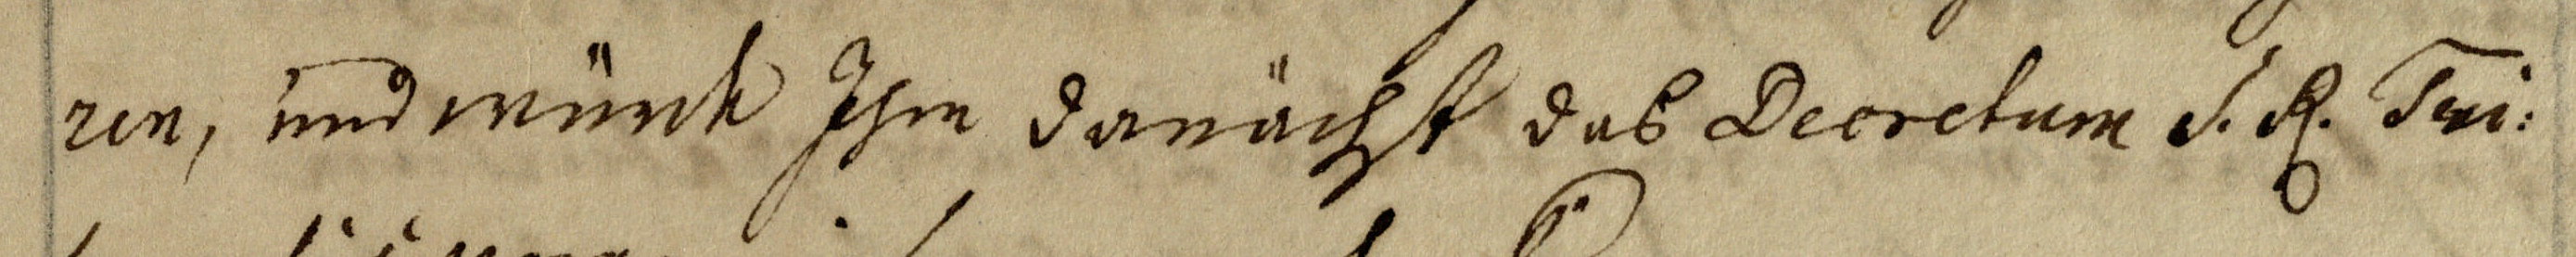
ren, und würde Ihm danächst das Decretum S. R. Tri¬
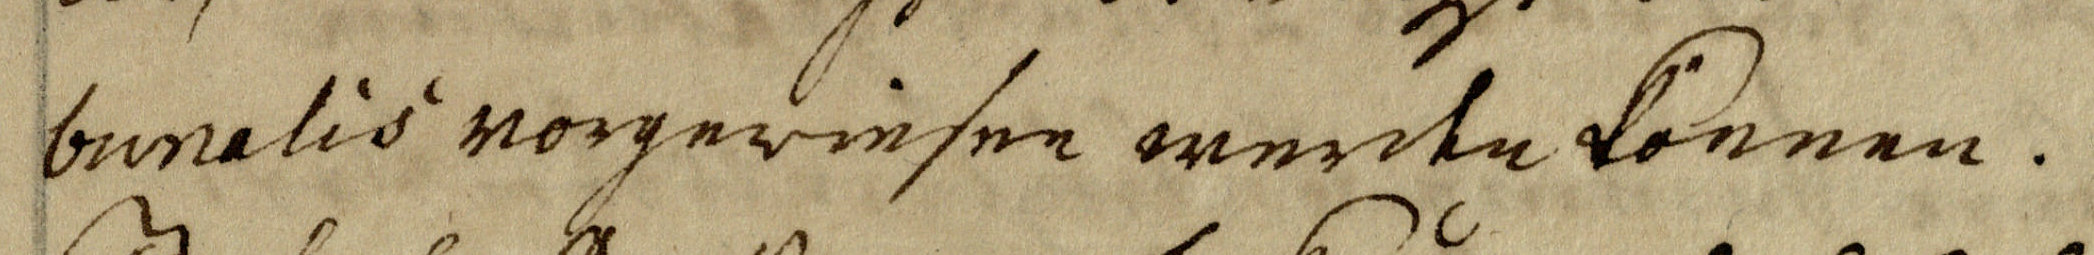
bunalis vorgewiesen werden können.
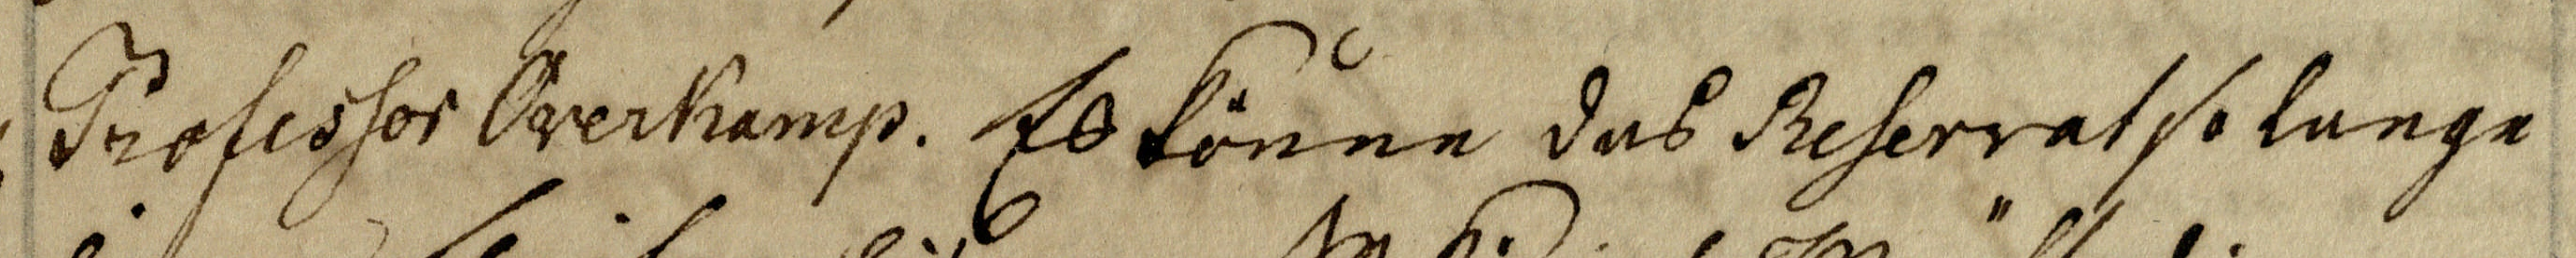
dh Professor Overkamp. Es könne das Reservat so lange
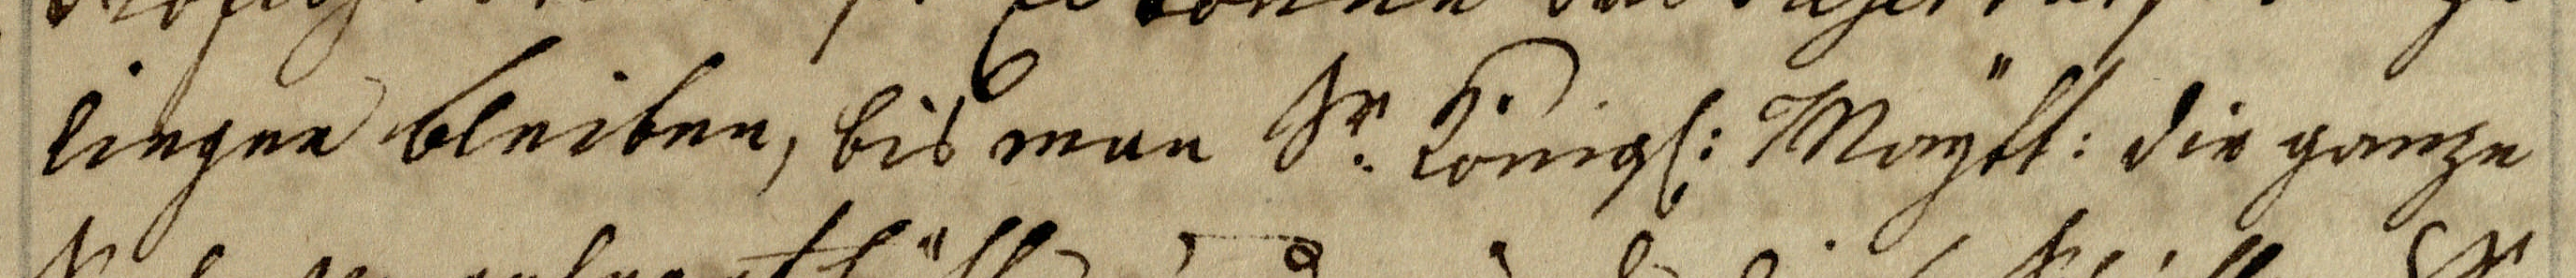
liegen bleiben, bis man Sr. Königl. Maÿtt. die ganze
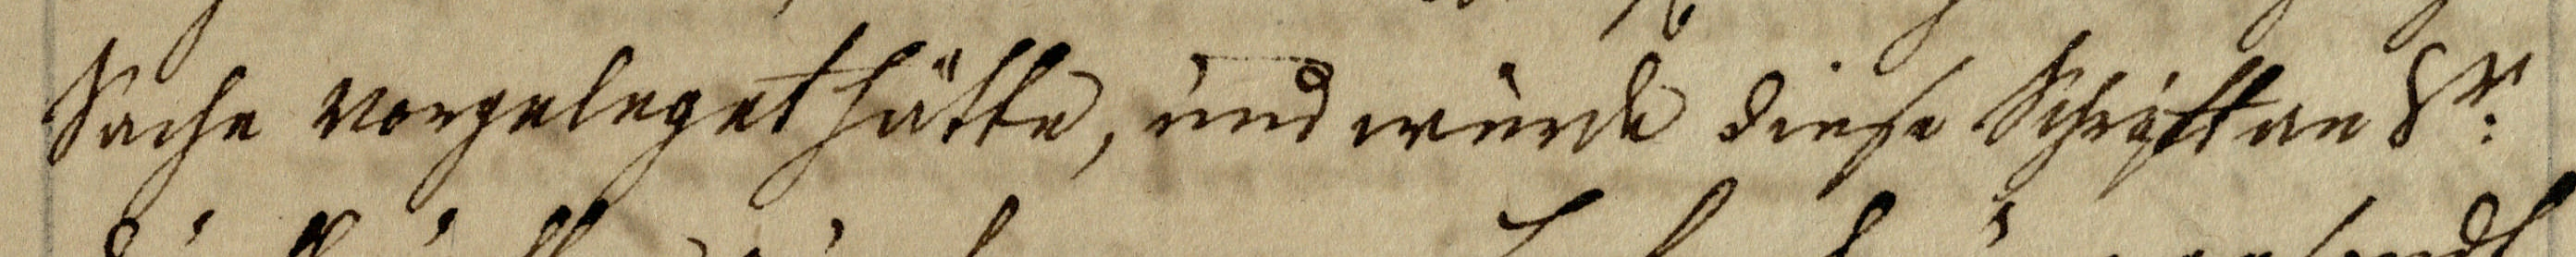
Sache vorgeleget hätte, und würde diese Schrift an Sr
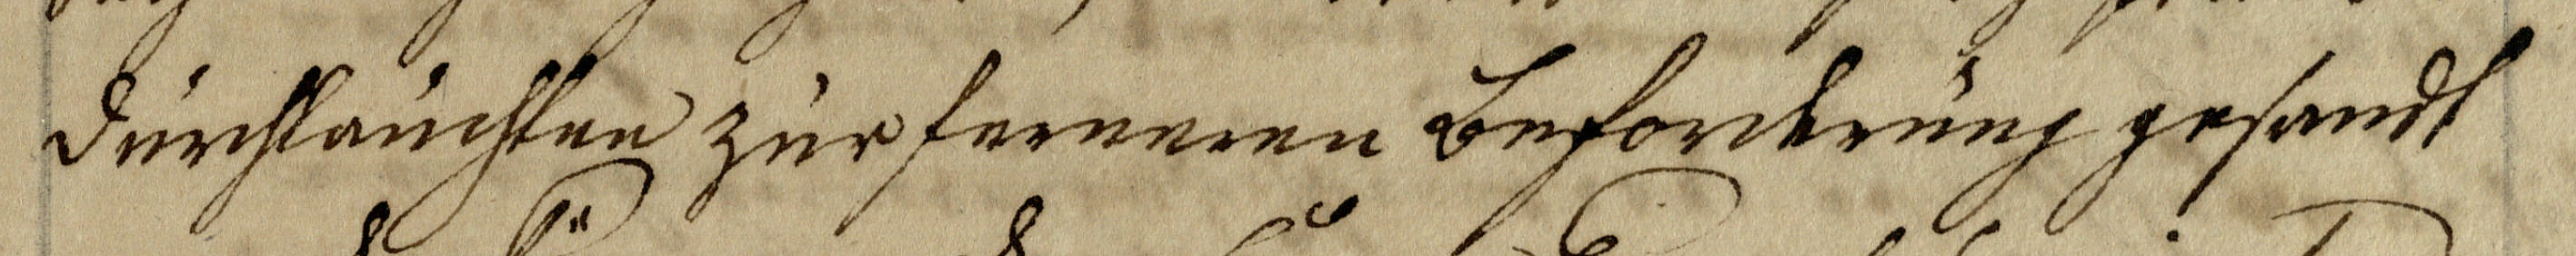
Durchlauchten zur ferneren Beforderung gesandt
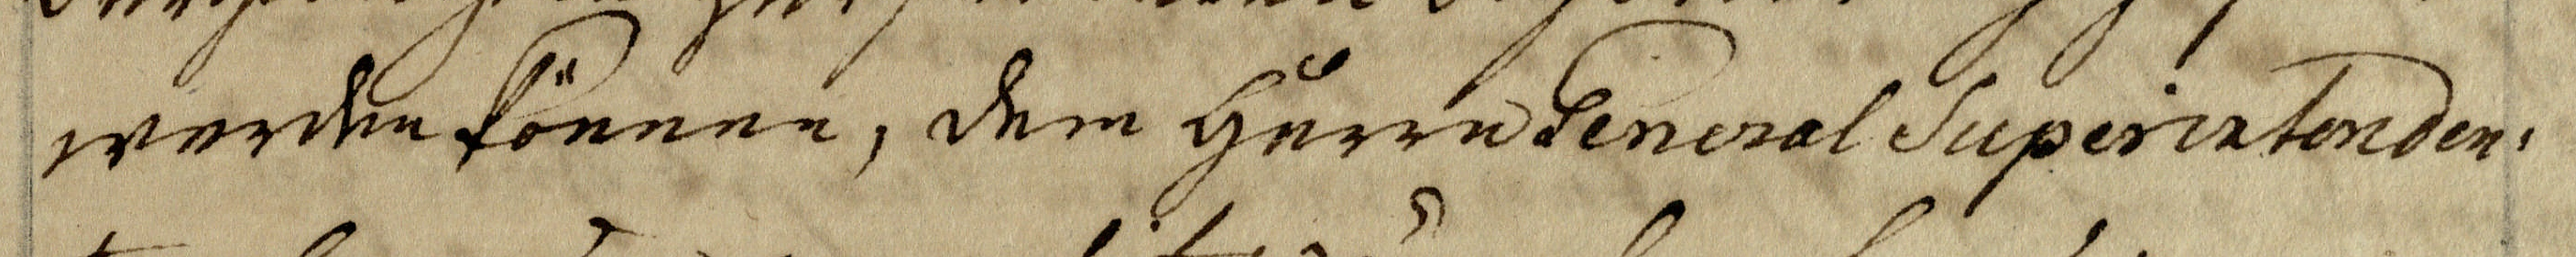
werden können, dem Herrn General Superintenden¬
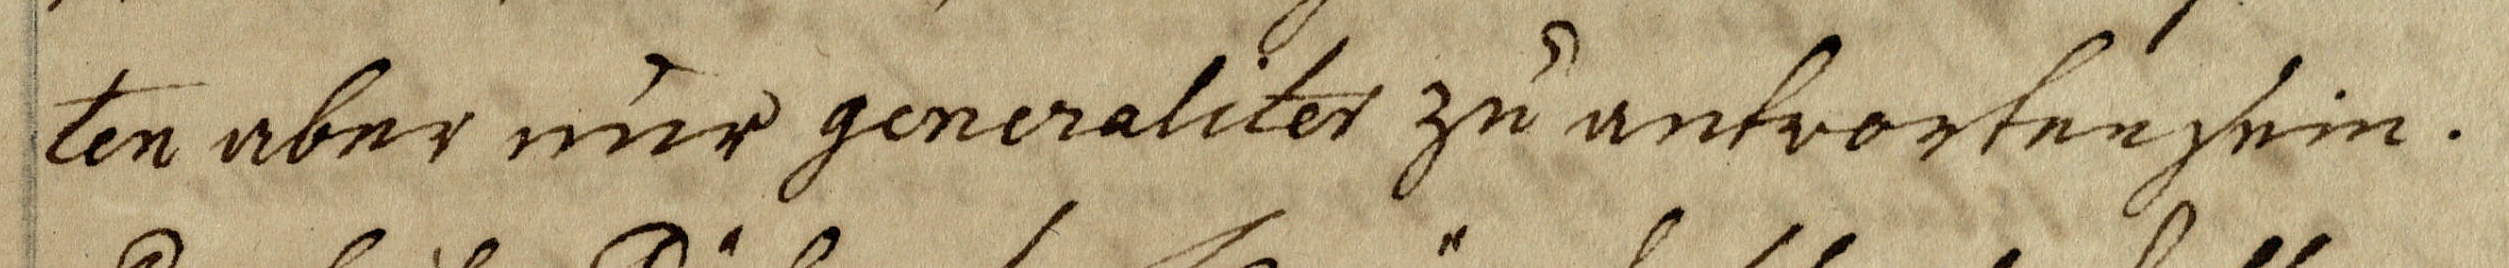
ten aber nur generaliter zu antworten sein.
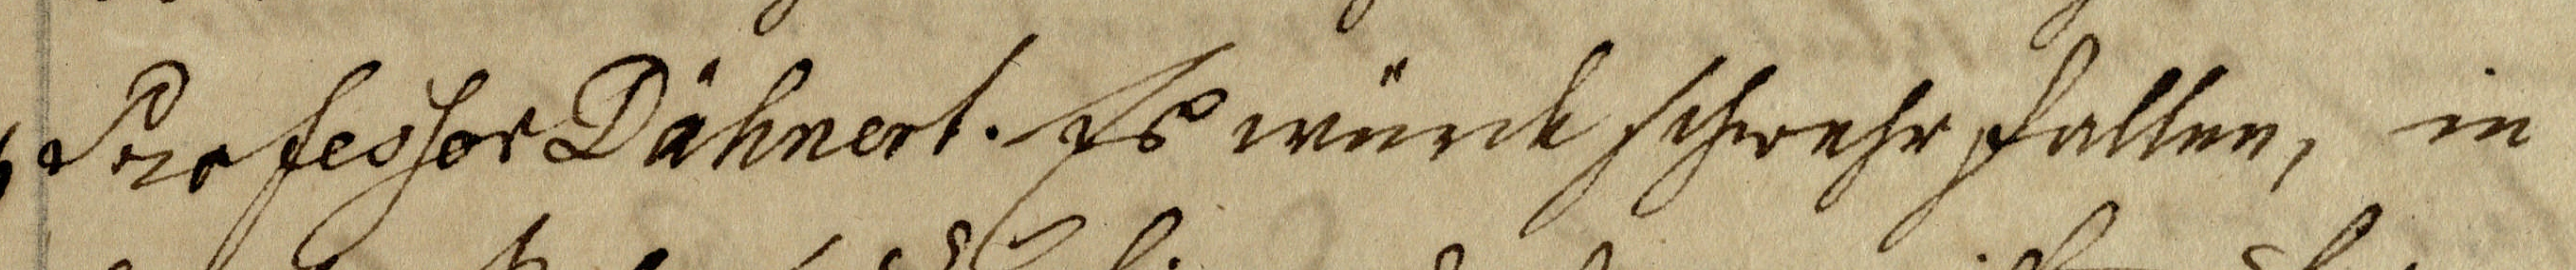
dh Professor Dähnert. Es würde schwehr fallen, in
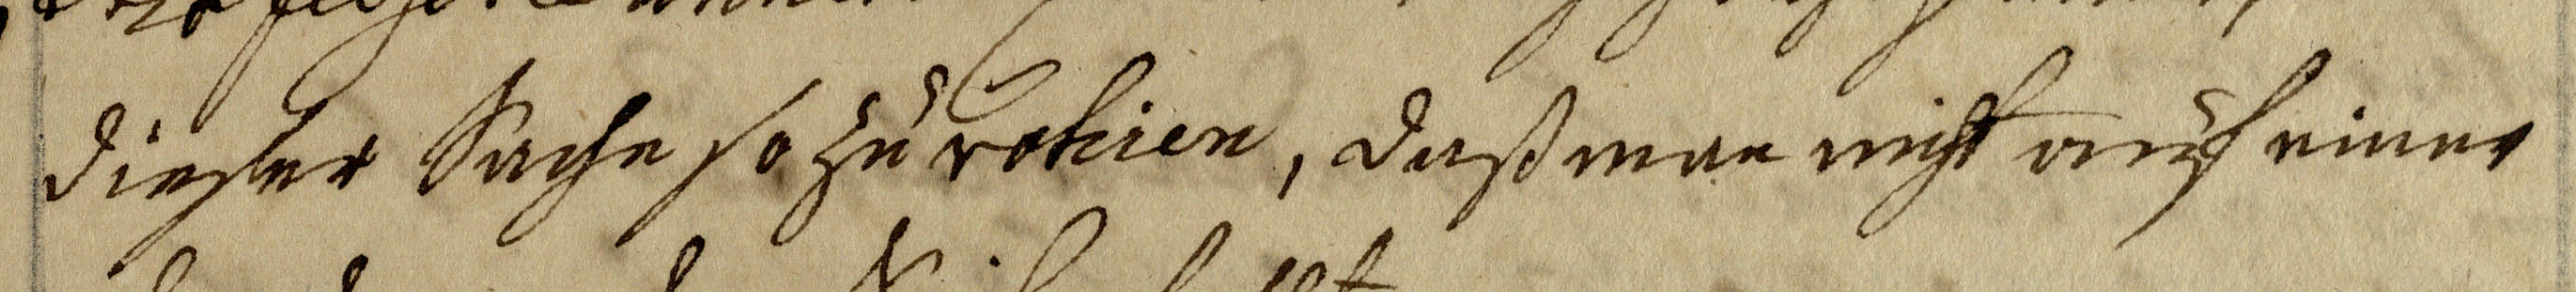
dieser Sache so zu votiren, daß man nicht auf einer
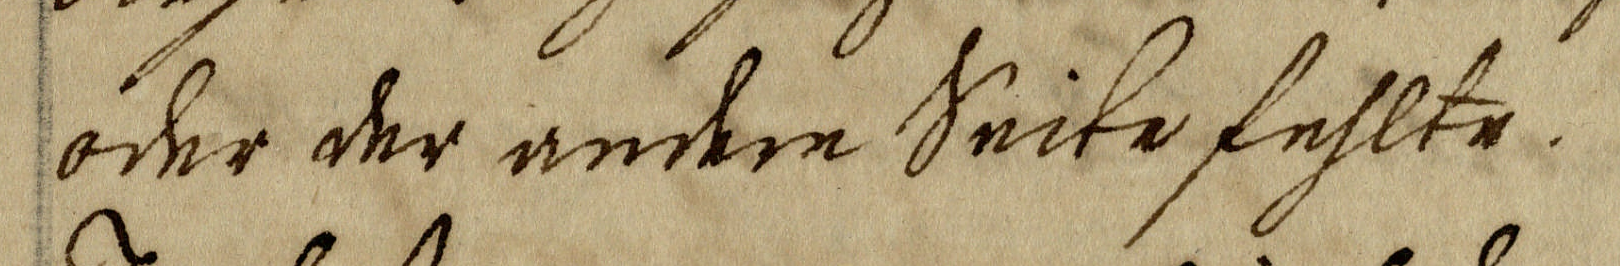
oder der andern Seite fehlte.
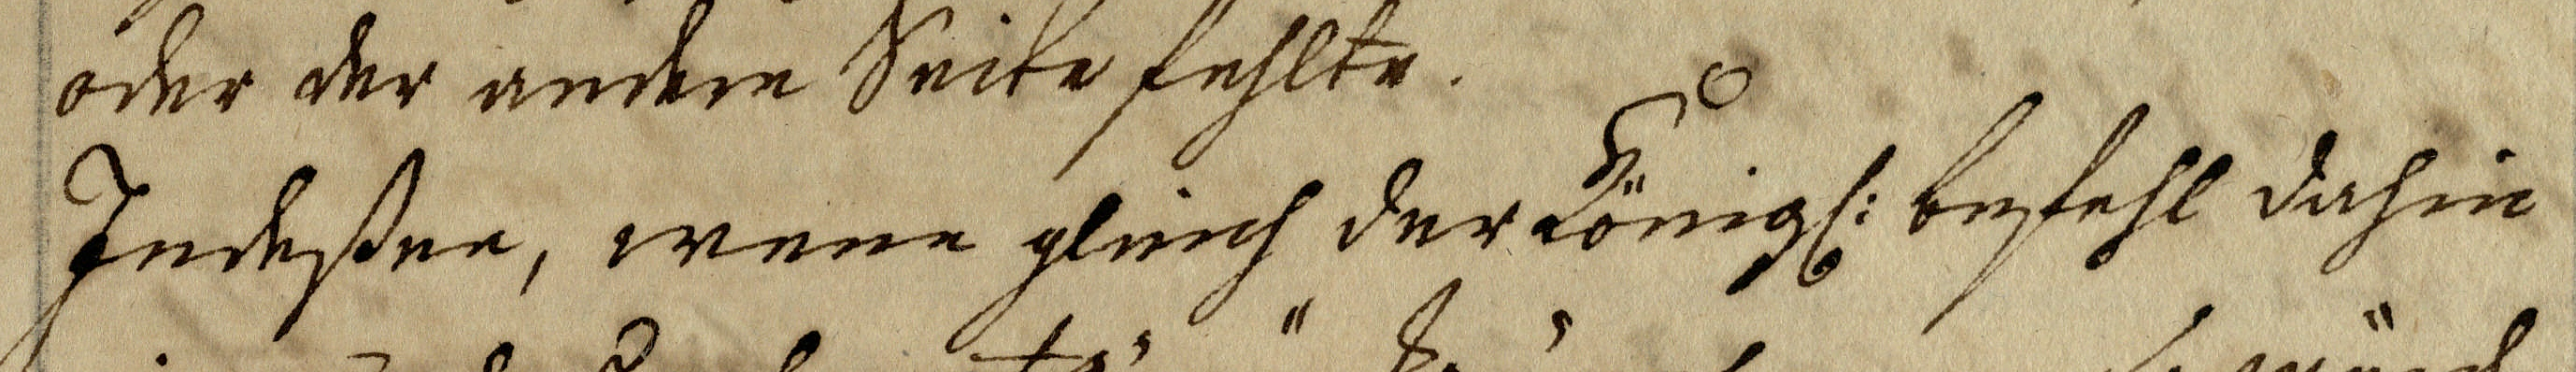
Indeßen, wenn gleich der Königl. Befehl dahin
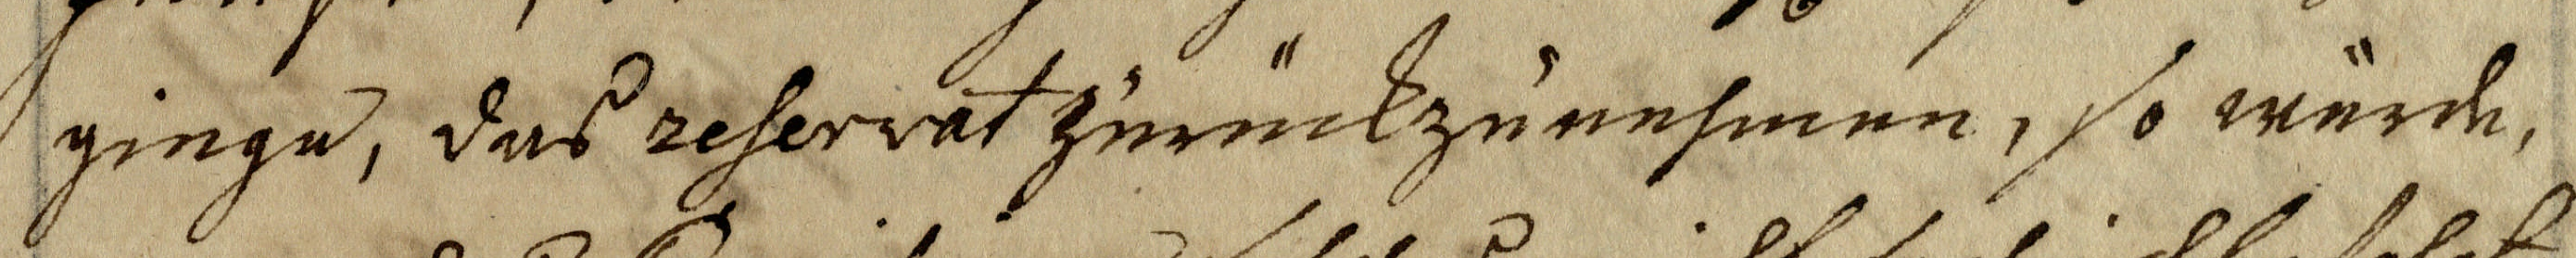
ginge, das reservat zurückzunehmen, so würde,
